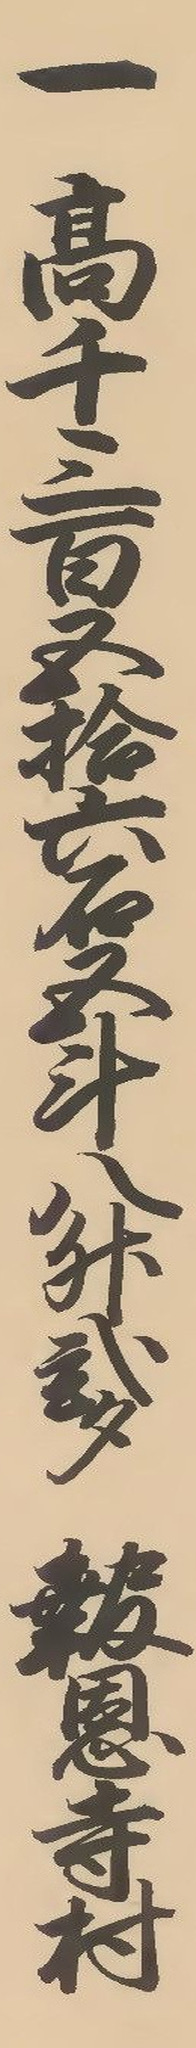一高千三百五拾六石五斗八升弐勺報恩寺村

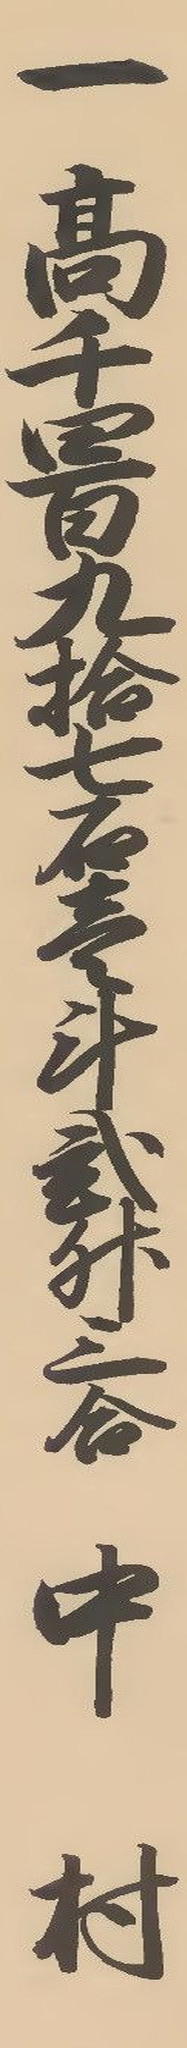一高千四百九拾七石壱斗弐升三合中村
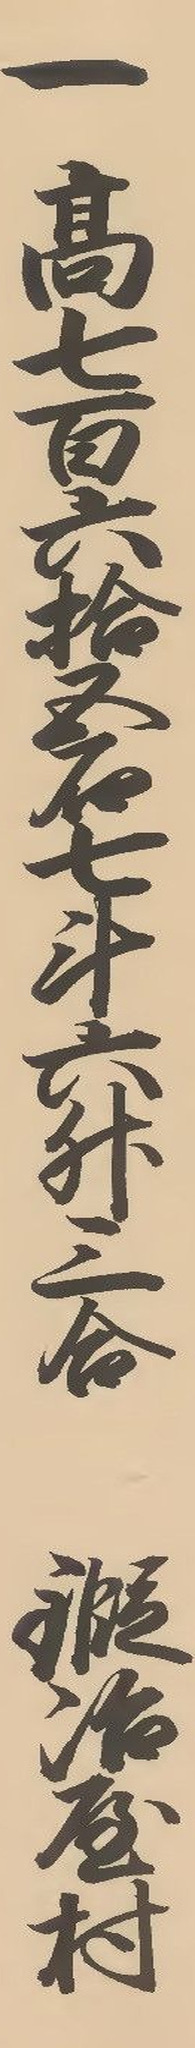一高七百六拾五石七斗六升三合鍛冶屋村
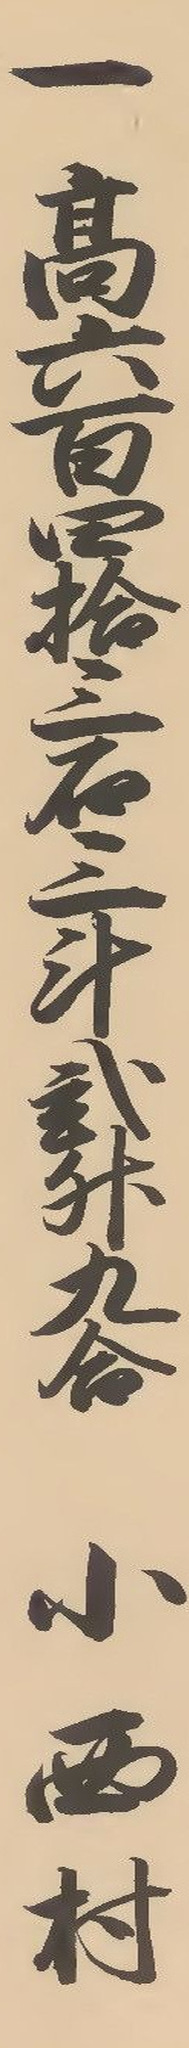一高六百四拾三石三斗弐升九合小西村
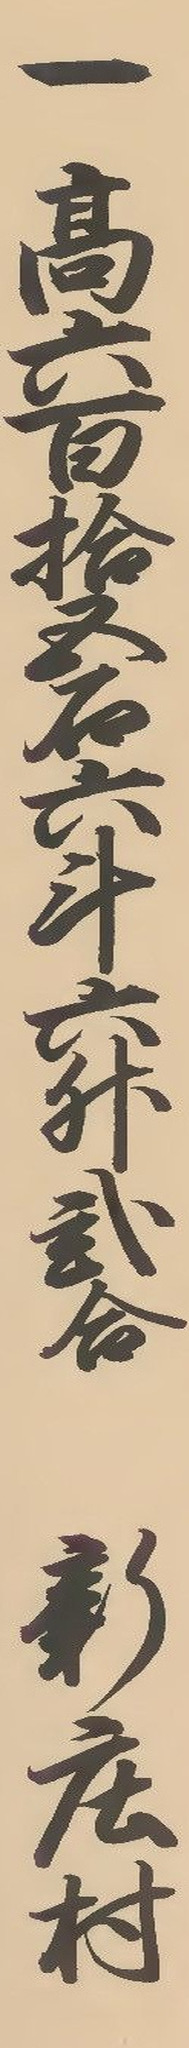一高六百拾五石六斗六升弐合新庄村
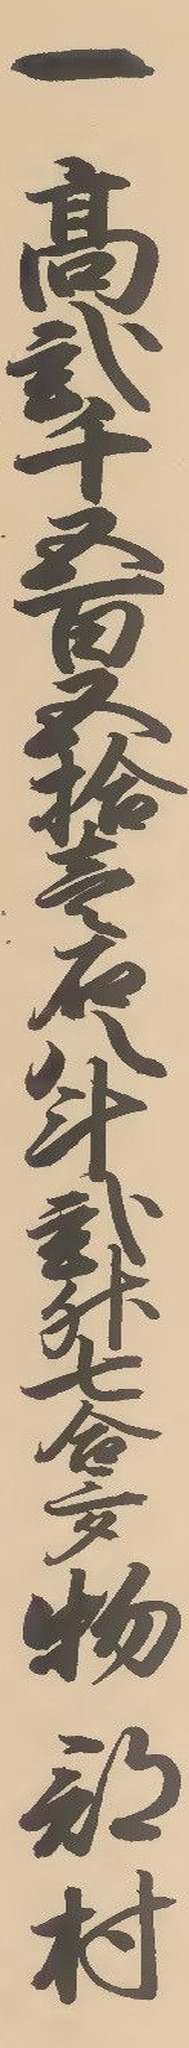一高弐千五百五拾壱石八斗弐升七合三勺物部村
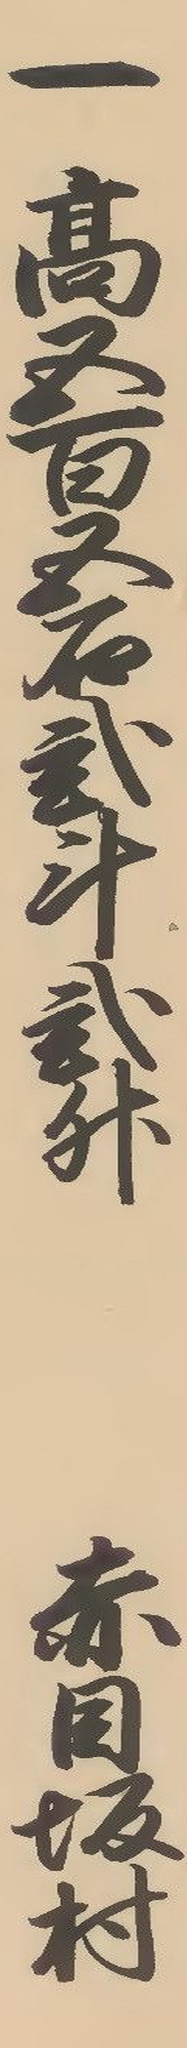一高五百五石弐斗弐升赤目坂村
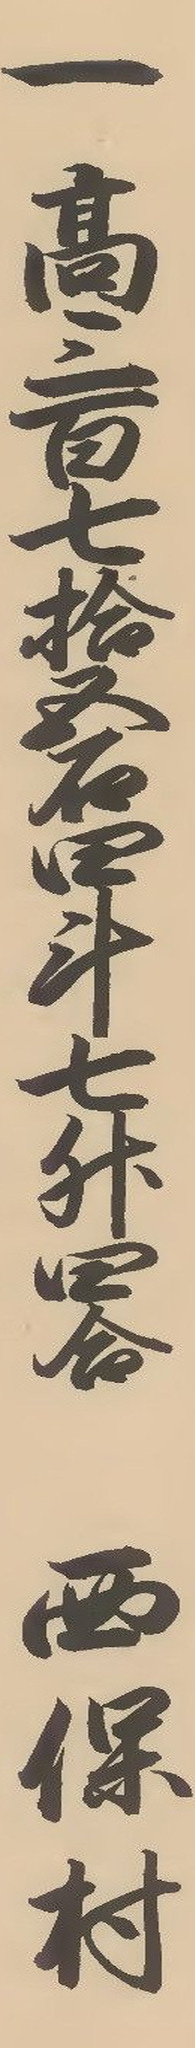一高三百七拾五石四斗七升四合西保村
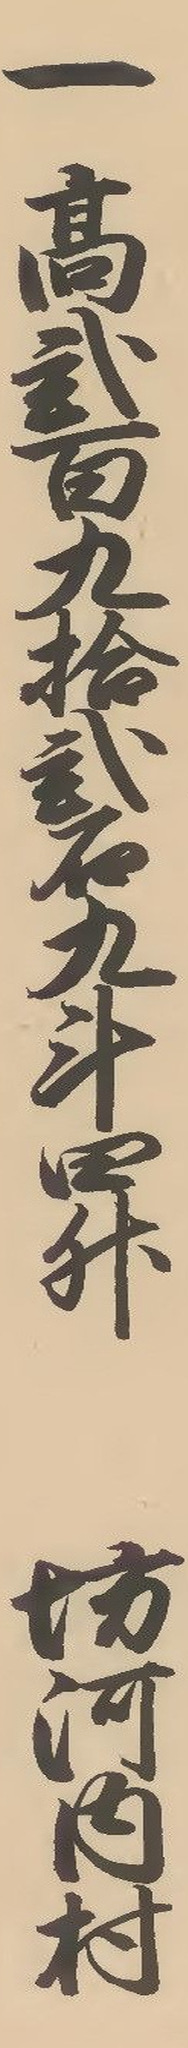一高弐百九拾弐石九斗四升坊河内村

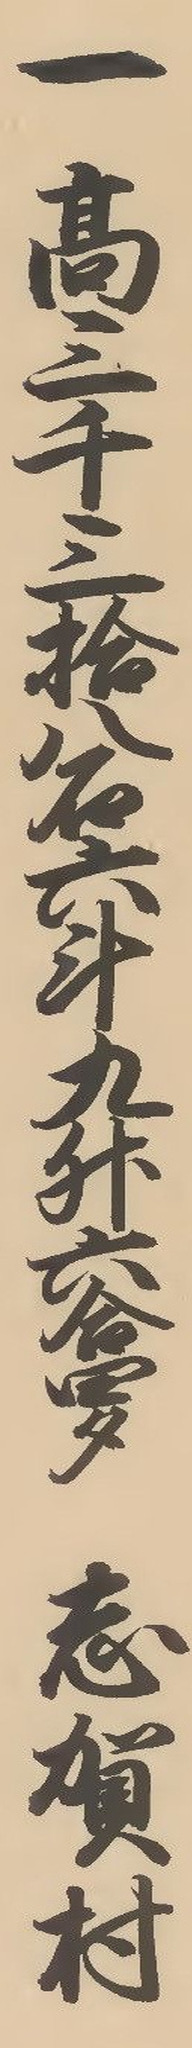一高三千三拾八石六斗九升六合四勺志賀村
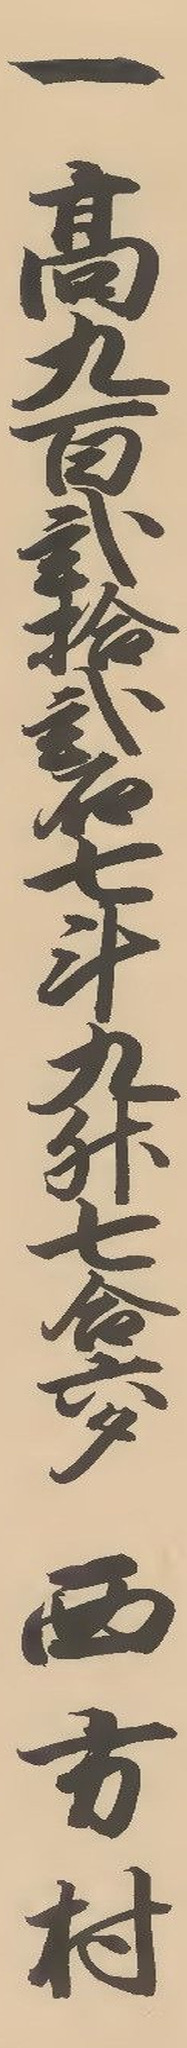一高九百弐拾弐石七斗九升七合六勺西方村
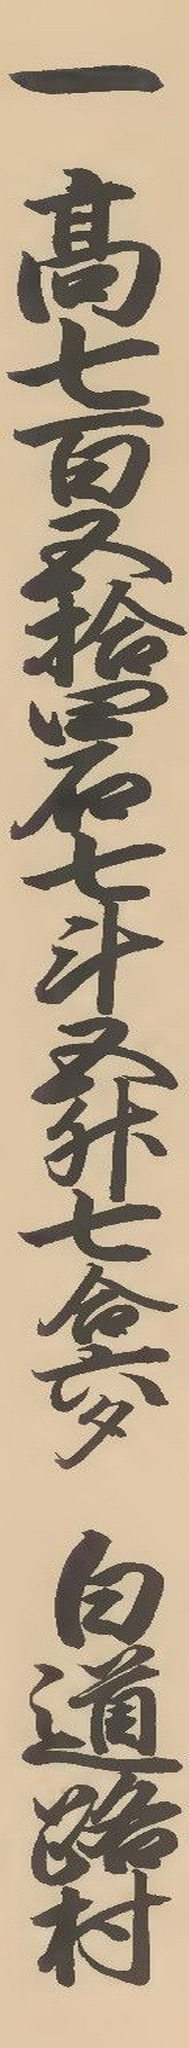一高七百五拾四石七斗五升七合六勺白道路村
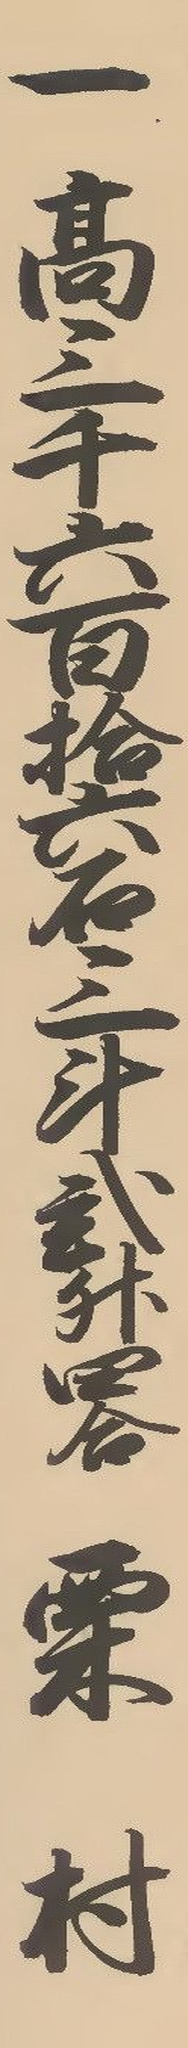一高三千六百拾六石三斗弐升四合栗村
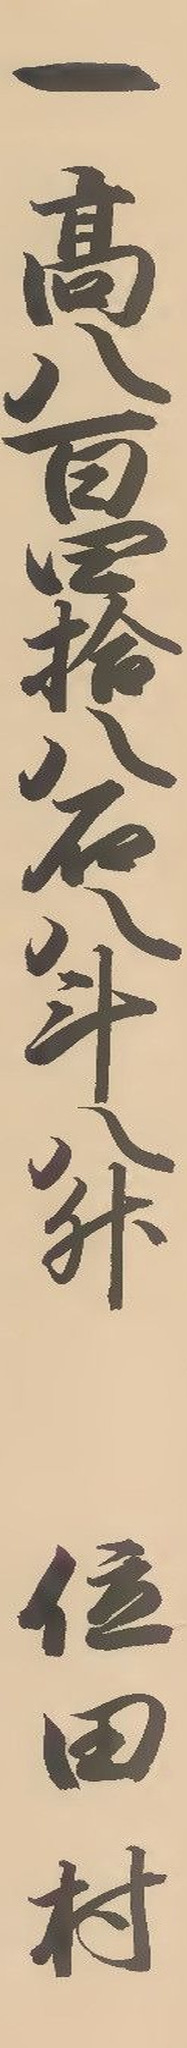一高八百四拾八石八斗八升位田村

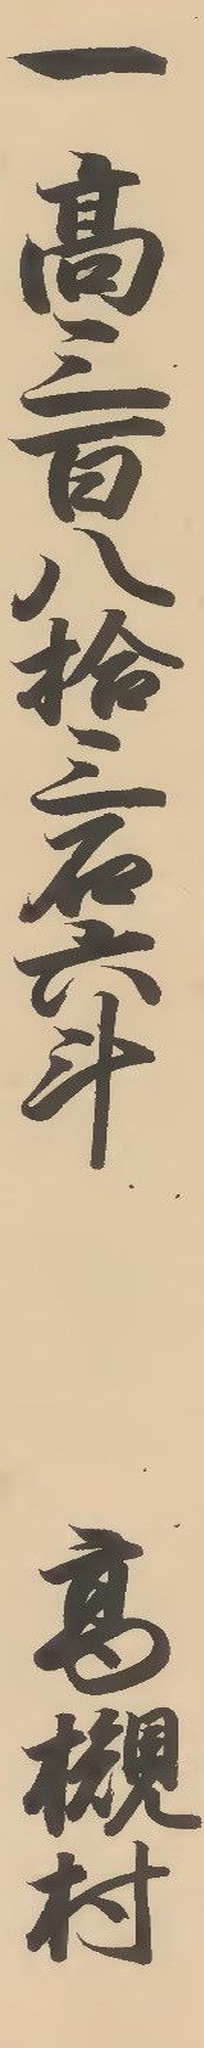一高三百八拾三石六斗高槻村
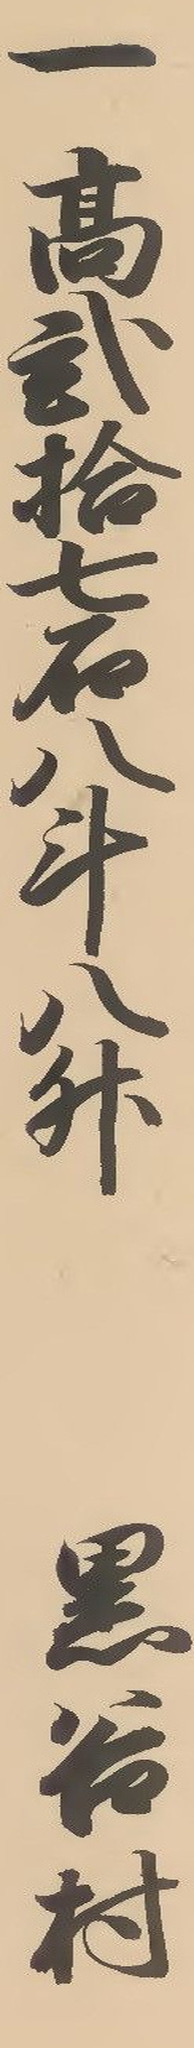一高弐拾七石八斗八升黒谷村
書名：丹波国郷帳
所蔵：国立公文書館 National Archives of Japan
